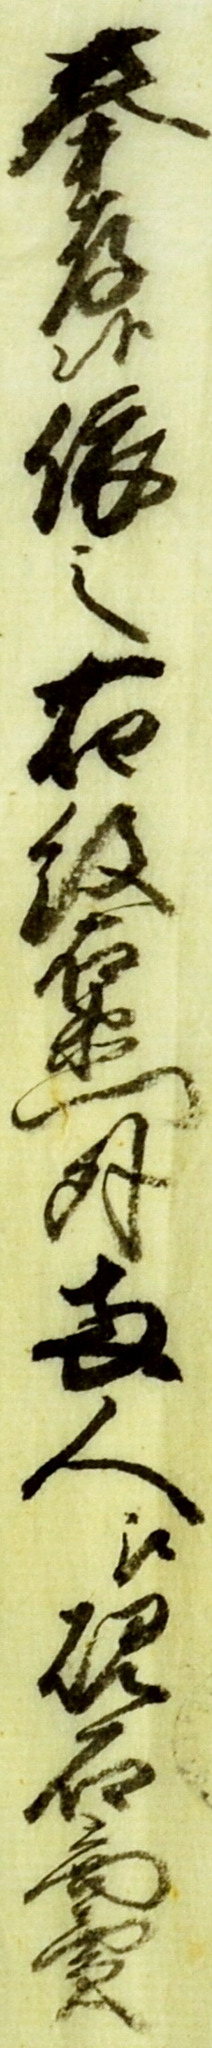奉存候依之右紋右衛門外両人江硯石商売
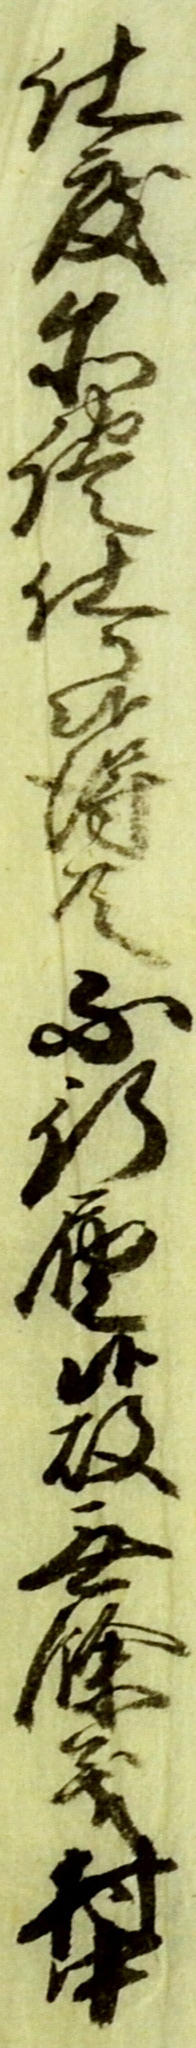仕度示談仕り候得共不行届候故無余義村中
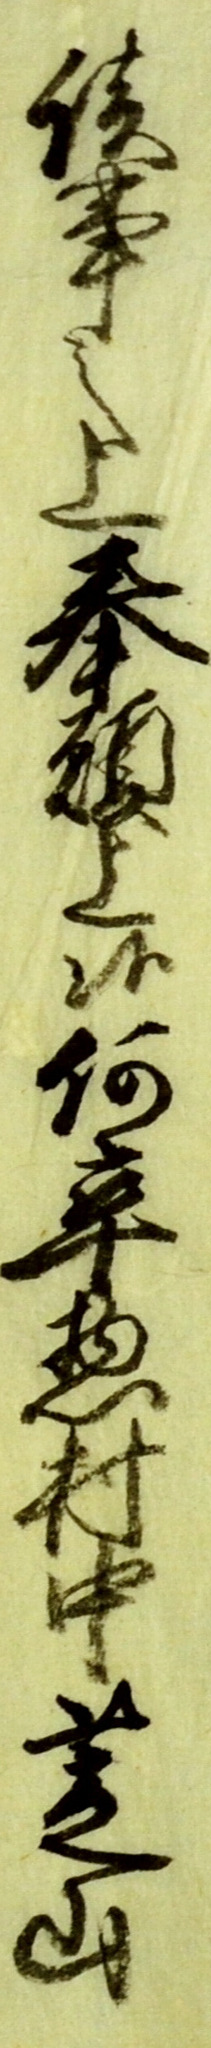談事之上奉願上候何卒惣村中芝山
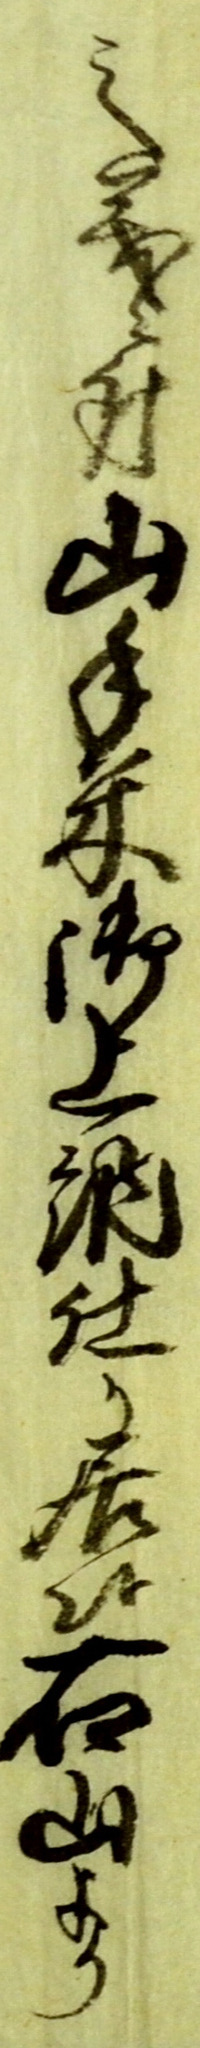之義ニ付山手米御上納仕り居候右山ゟ
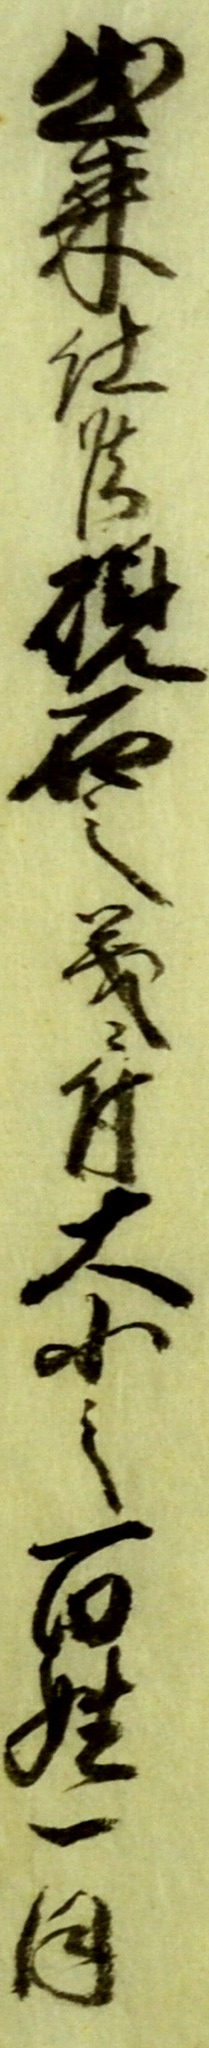出来仕候硯石之義ニ付大小之百姓一同

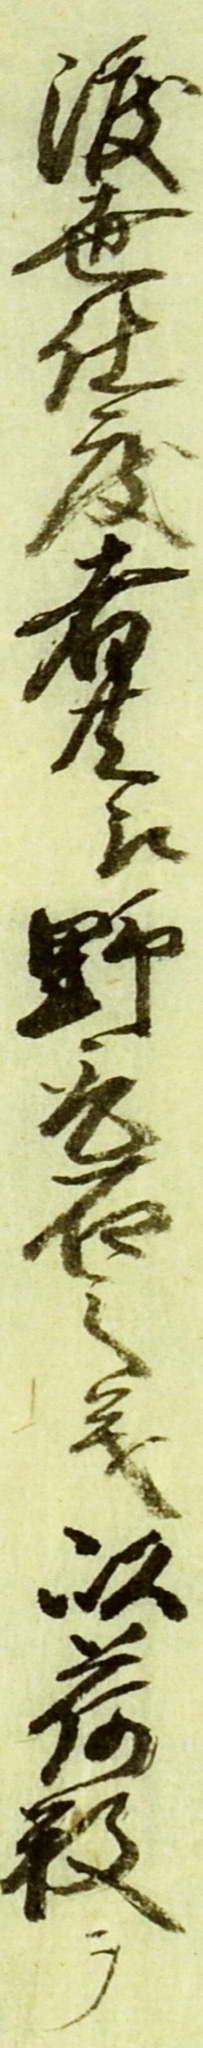渡世仕度者共江野取石之義以荷数ヲ
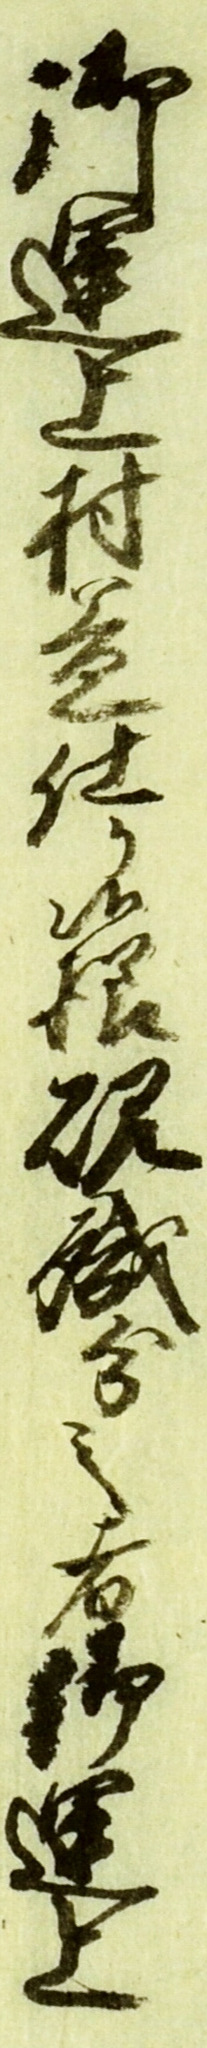御運上村益仕り候様硯職分之者御運上
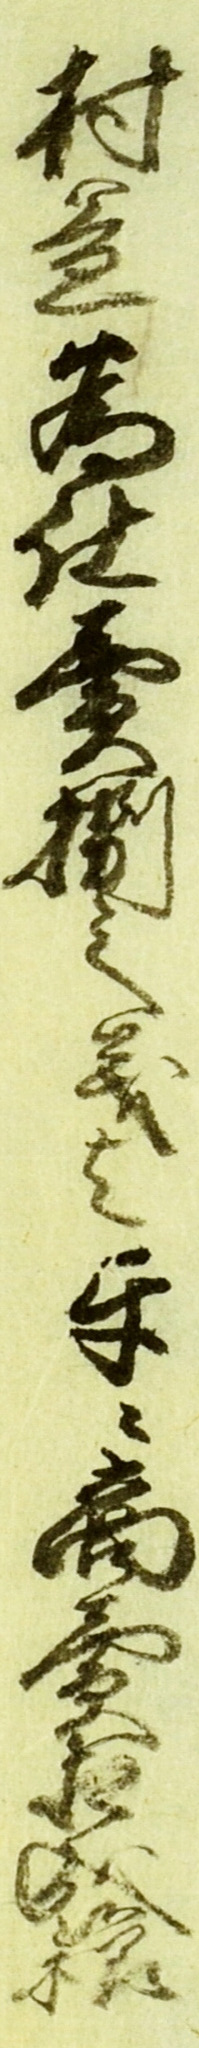村益為仕売捌之義者互ニ商売相成候様
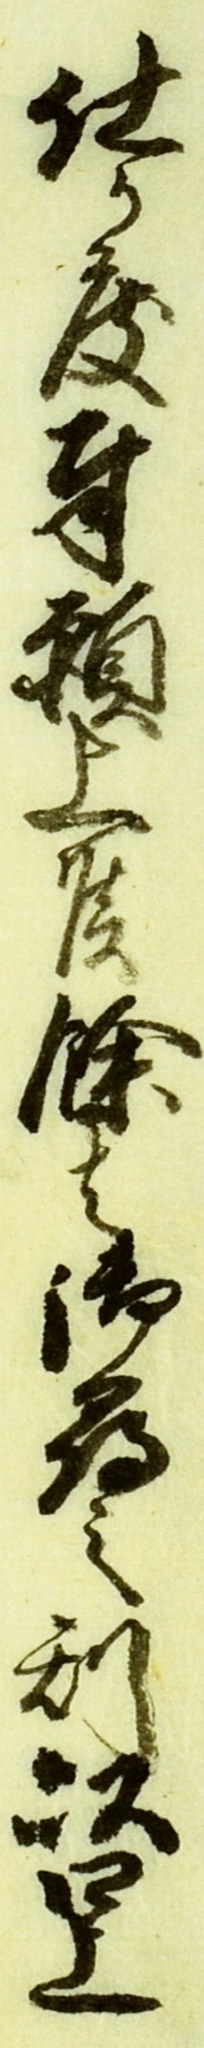仕り度奉願上候余者御尋之刻以口上
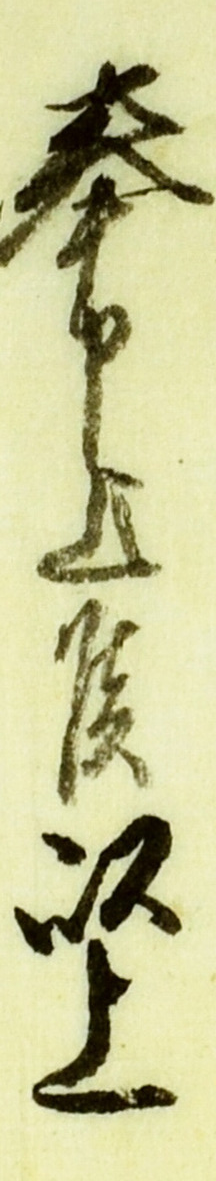奉申上候以上
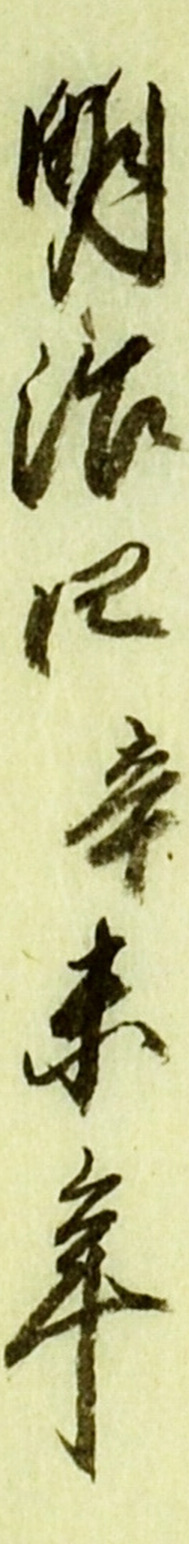明治四辛未年
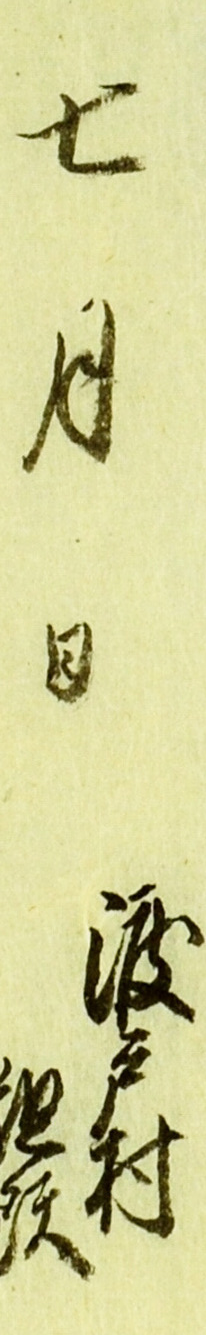七月日渡戸村
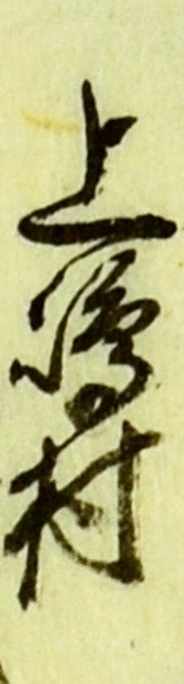上嶋村
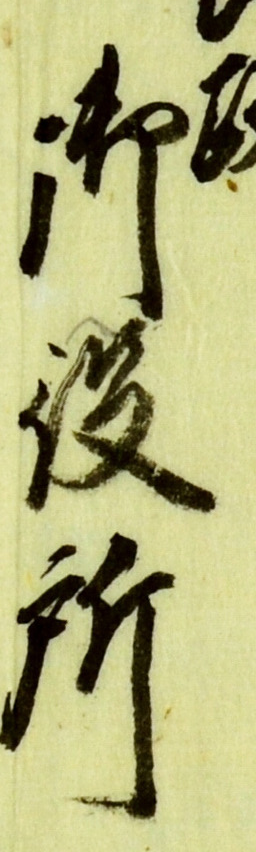御役所

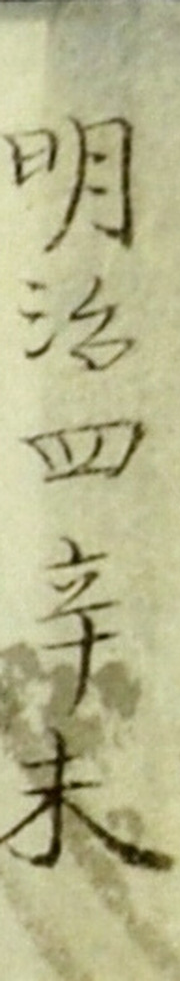明治四辛未
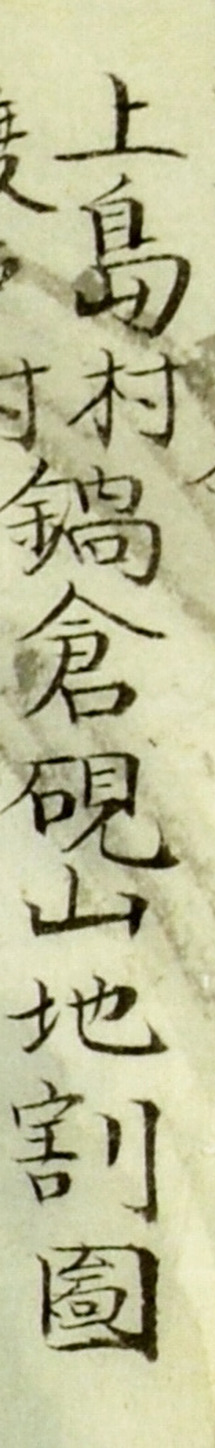渡戸村鍋倉硯山地割図
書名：乍恐以書付奉願上候御事
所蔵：伊那市立高遠町図書館・合同会社AMANE
